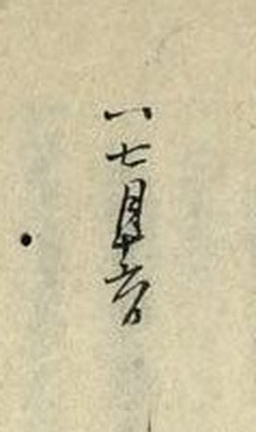一七月十九日
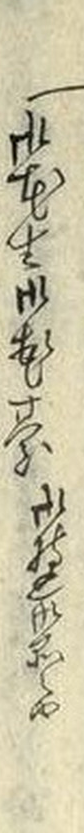御花生御敷台御持込御品之由
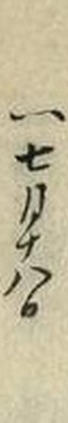一七月十九日
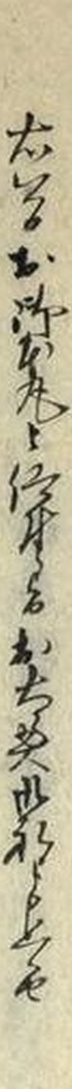右今日於御本丸被仰付候旨於大奥御礼被申上候由
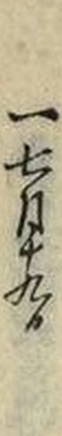一七月十九日

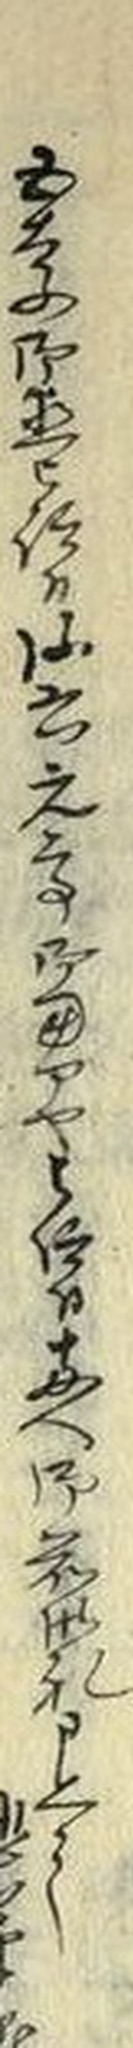五太夫御直被仰付弥六元亭御用部屋被仰付両人御前御礼申上之
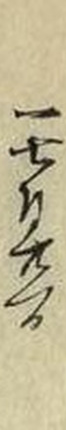一七月廿一日
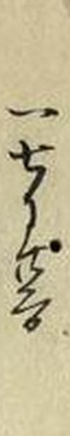一七月廿一日
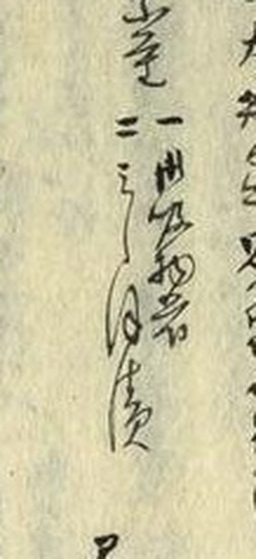二みしほ漬
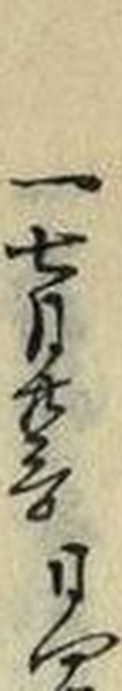一七月廿三日
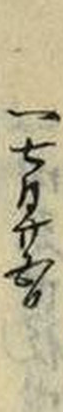一七月廿五日
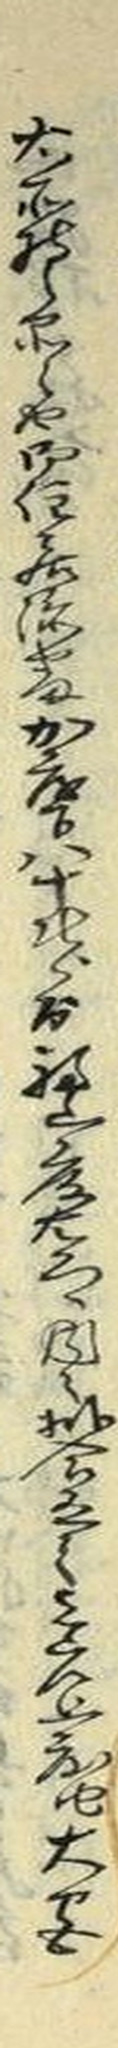右所持之品之由御住居添番加茂下八十次郎ゟ福山藤右衛門へ内々掛合有之被差上度由大宮
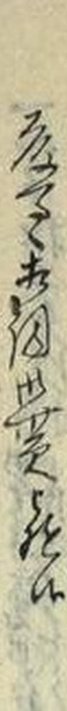藤馬へ相伺御貰被遊候
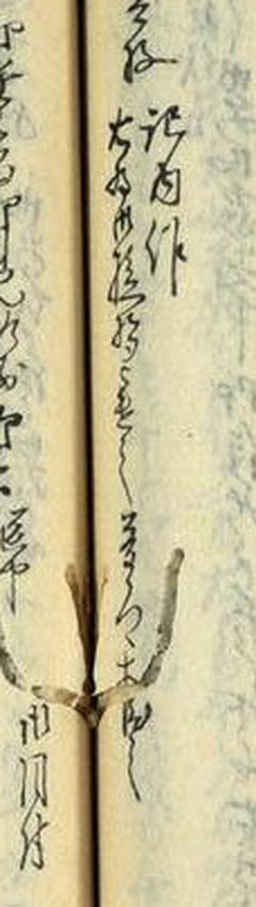右為御挨拶被遣之藤右衛門へ相渡之同人江
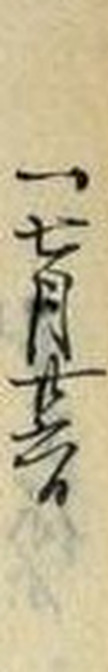一七月廿一日
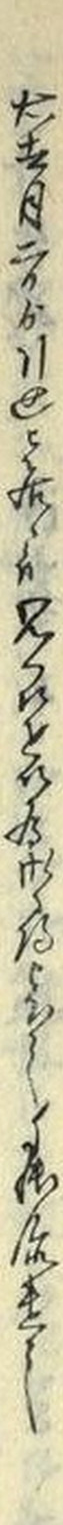右去月二日ゟ引込被居候ニ付思召を以為御尋被下之手紙添遣之
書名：少傅日録抄（斉善付側向頭取日記、在府）
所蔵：福井県文書館 Fukui Prefectural Archives
